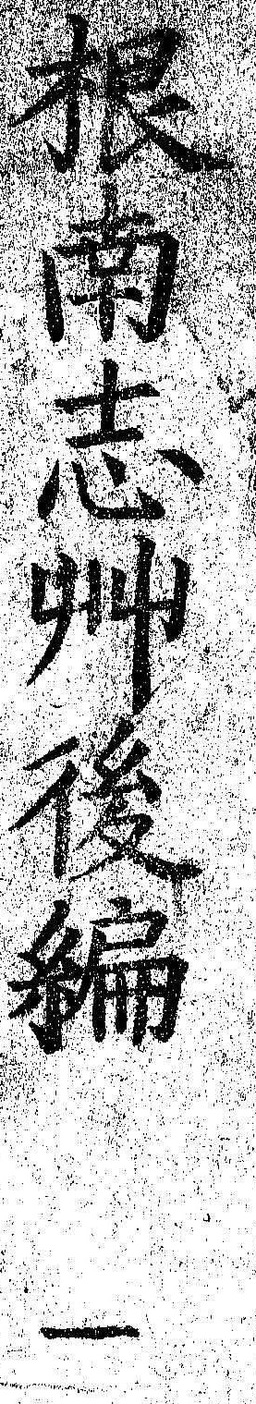根南志艸後編一

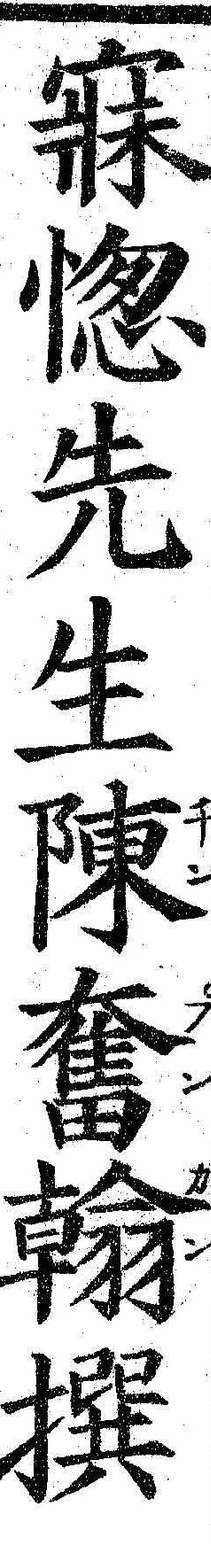寝惚先生陳奮翰撰
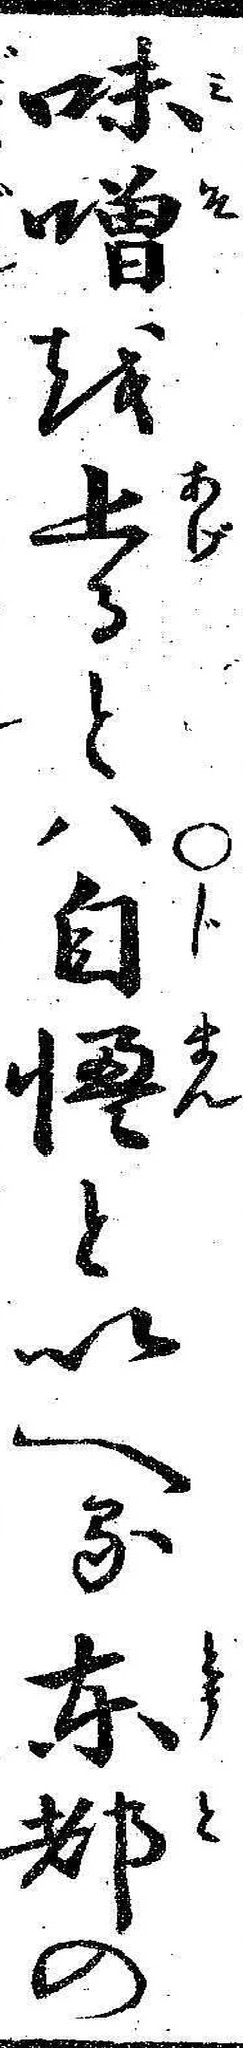味噌を上るとは。自慢といへる東都の
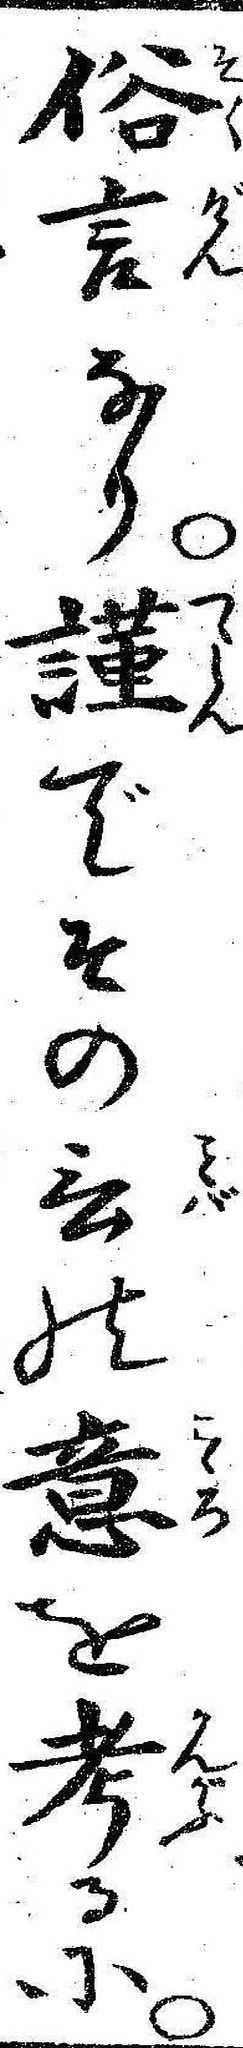俗言なり。謹でその言の意を考るに。
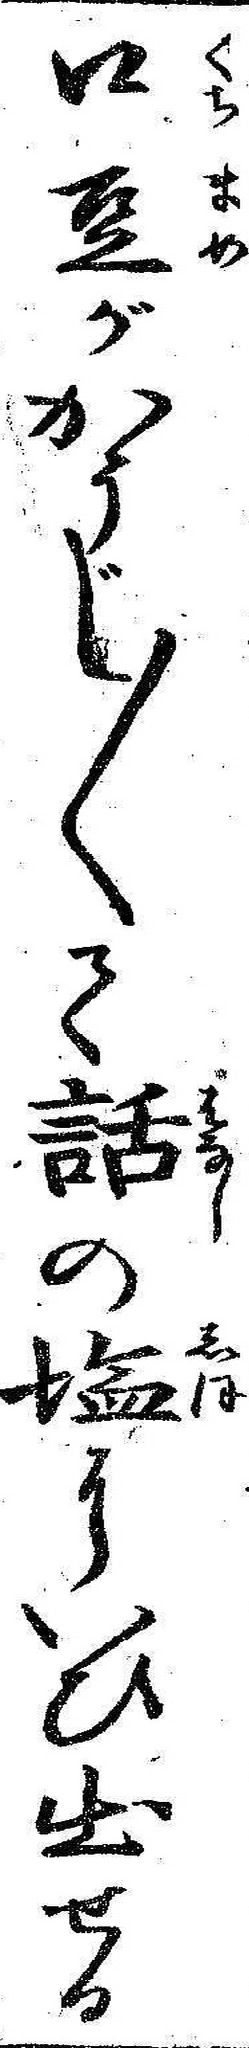口豆がかうじ〳〵て話の塩にいひ出せる
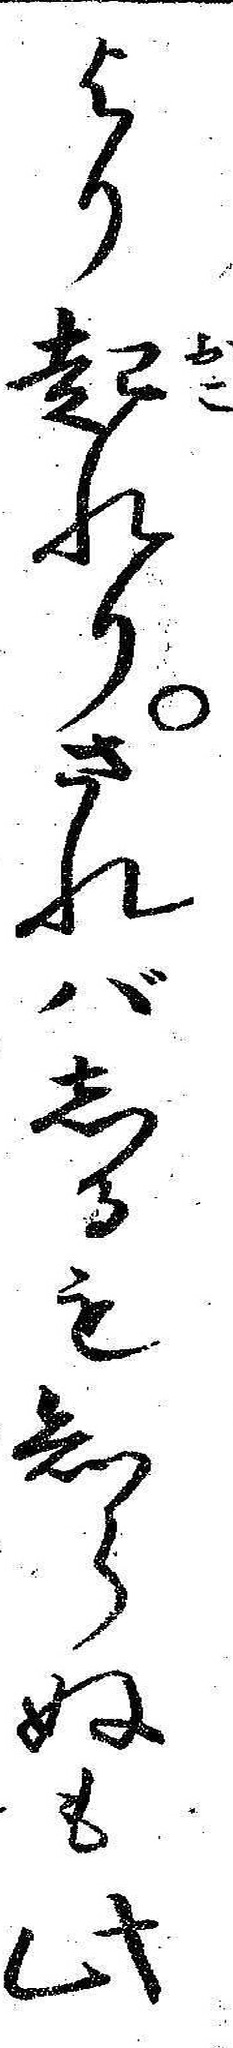より起れり。さればしるも知らぬも此
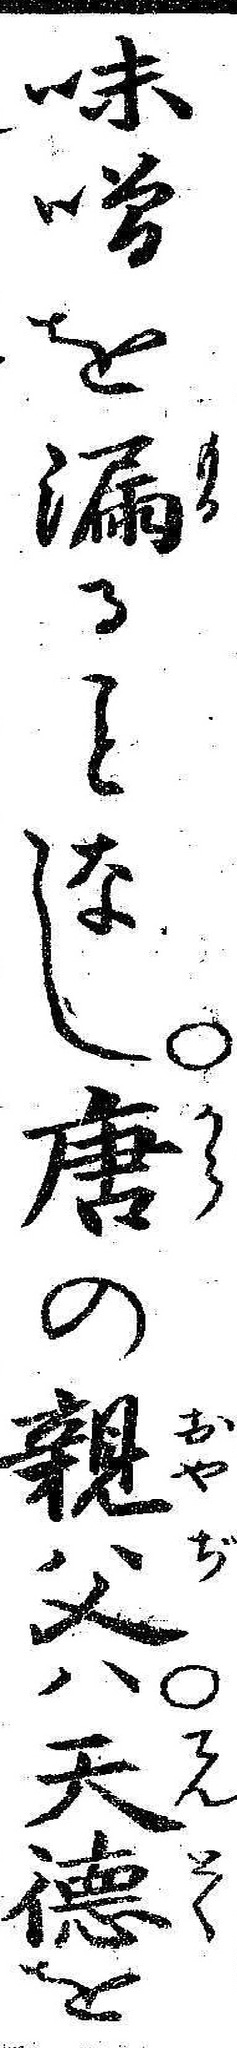味噌を漏ることなし。唐の親父は。天徳を
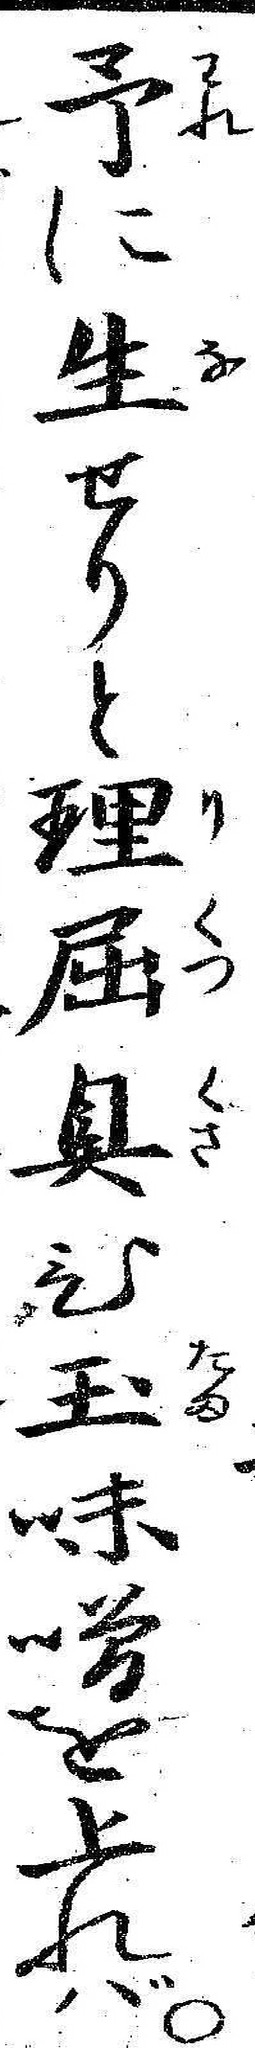予に生せりと理屈臭ひ玉味噌を上れば。
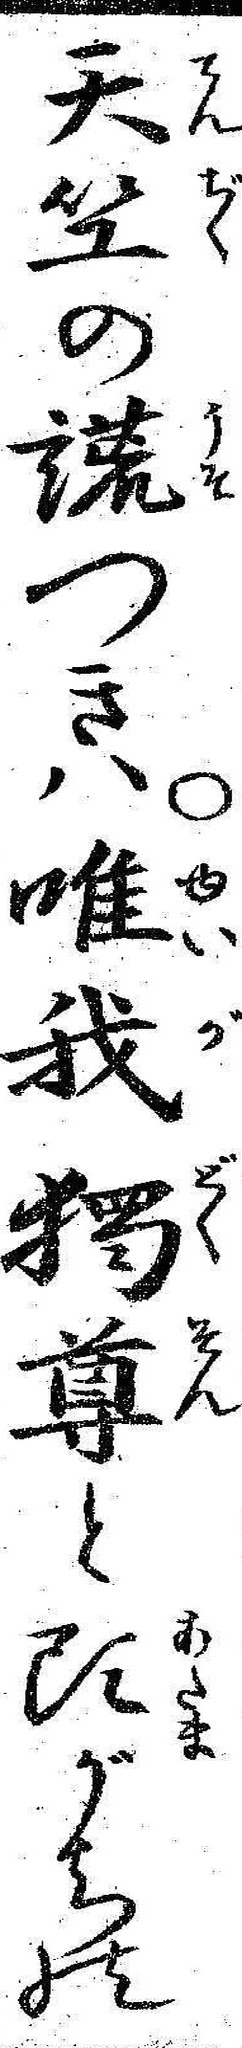天竺の謊つきは。唯我独尊と頭がちの

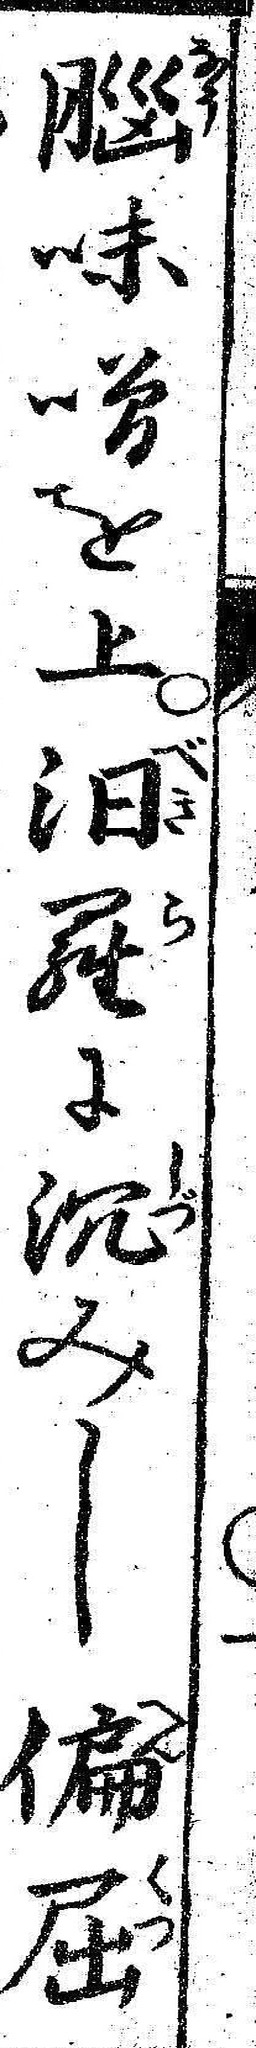脳味噌を上。汨羅に沈みし偏屈
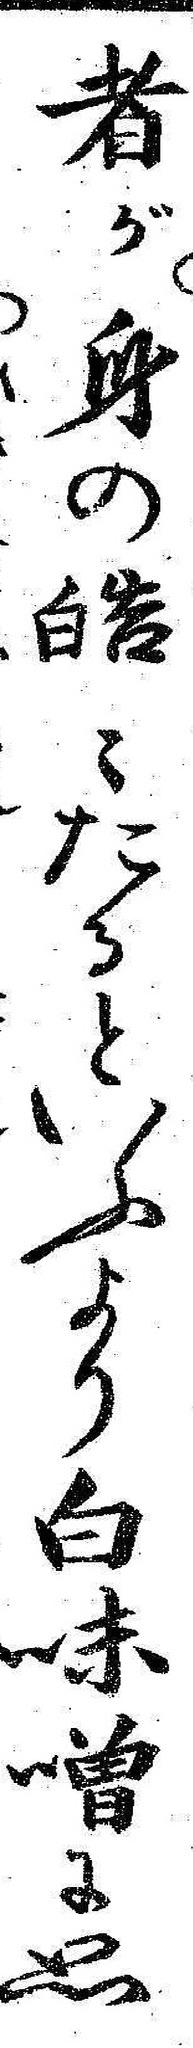者が。身の皓々たるといふより白味噌に思
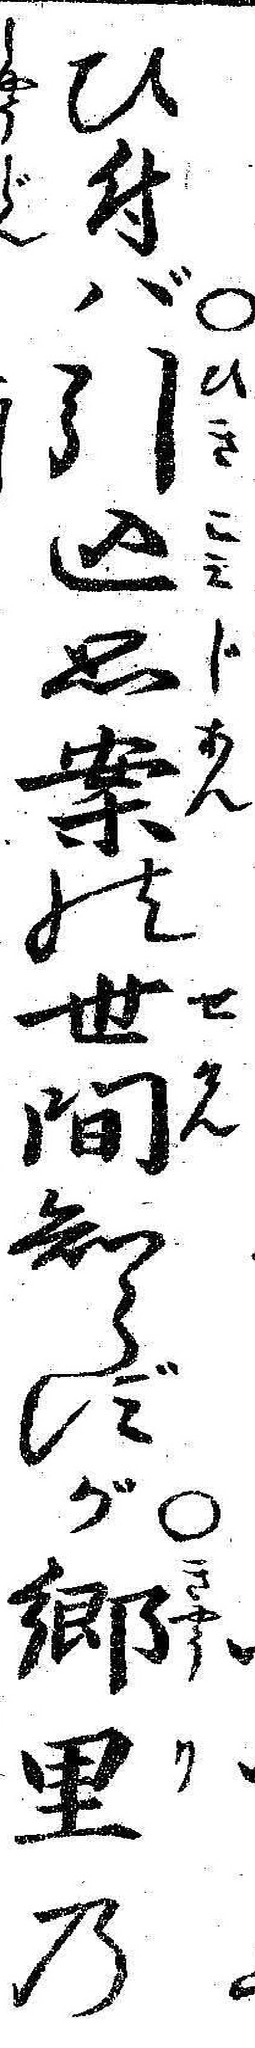ひ付ば。引込思案の世間しらずが。郷里の
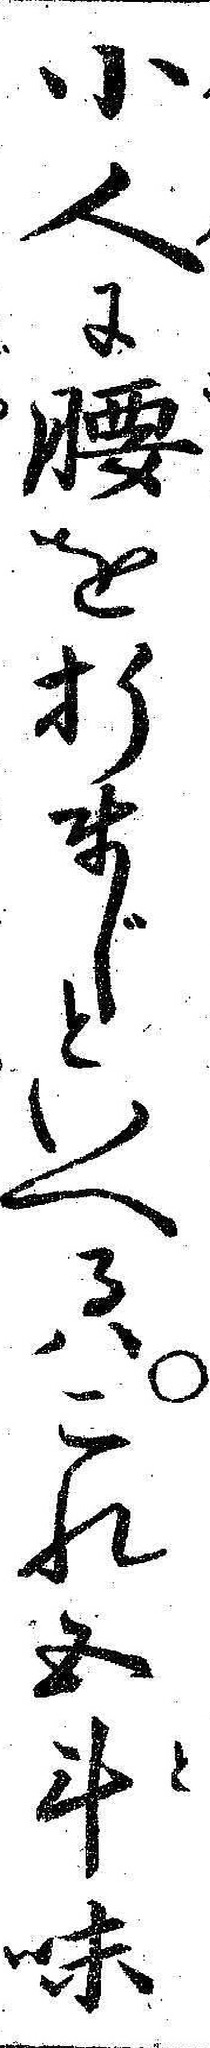小人に腰を折まじといへるは。これ五斗味
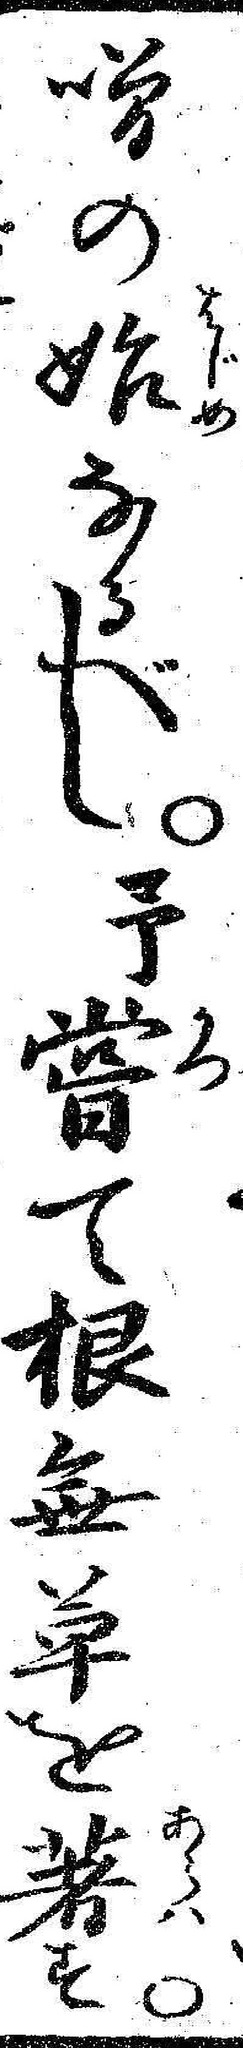噌の始なるべし。予嘗て根無草を著す。
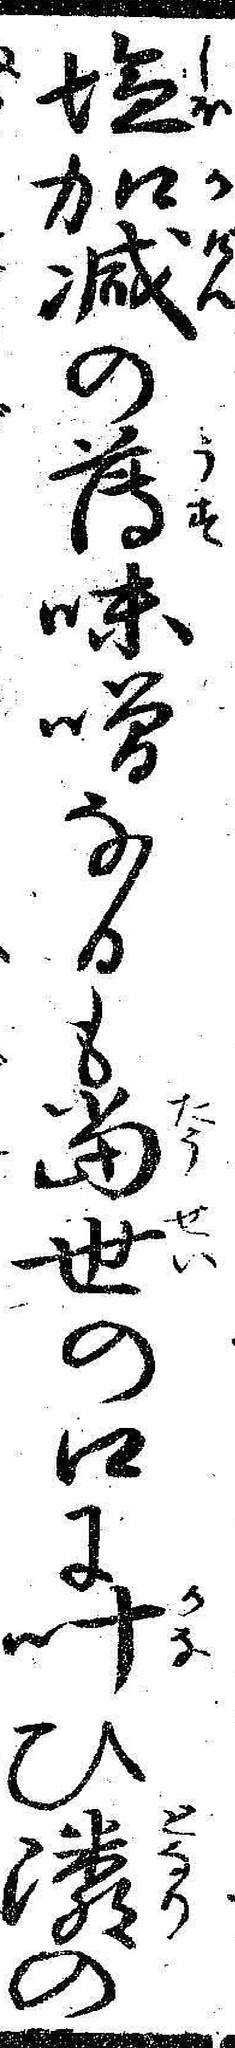塩加減の薄味噌なるも当世の口に叶ひ隣の
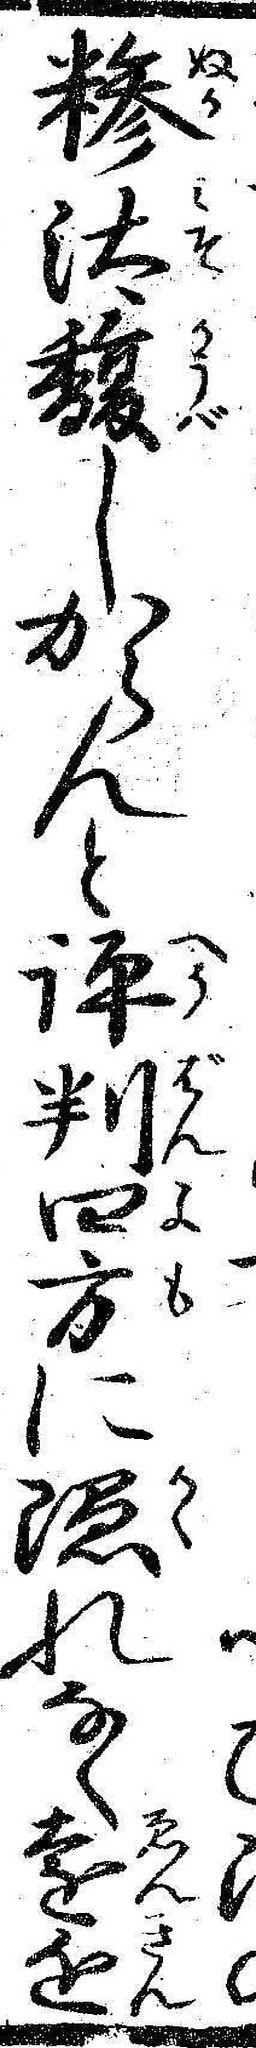糁汰馥しからんと評判四方に隠れなく遠近
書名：根無草後編
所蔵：国文学研究資料館
